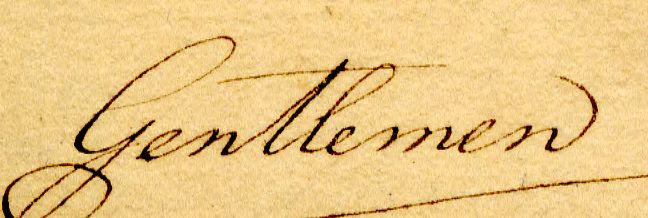Gentlemen
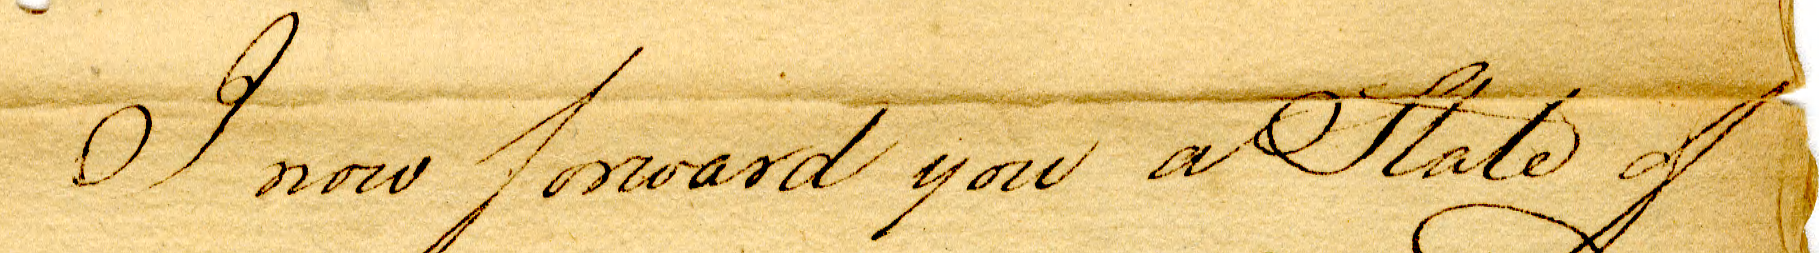I now forward you a State of
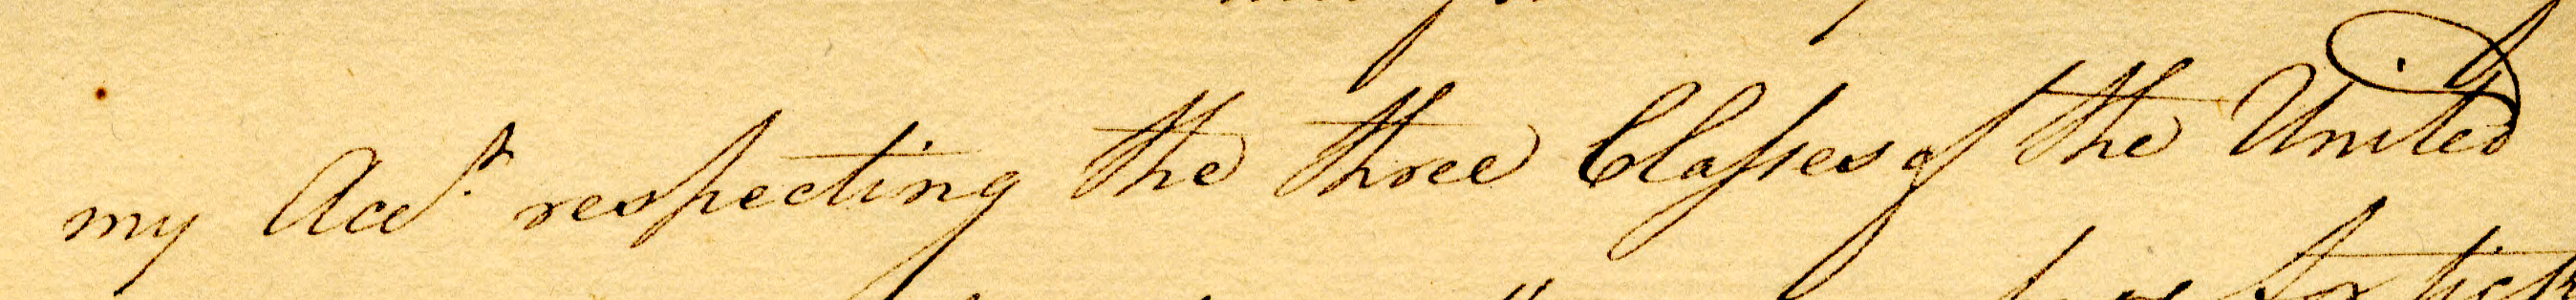my Acc^t. respecting the three Classes of the United
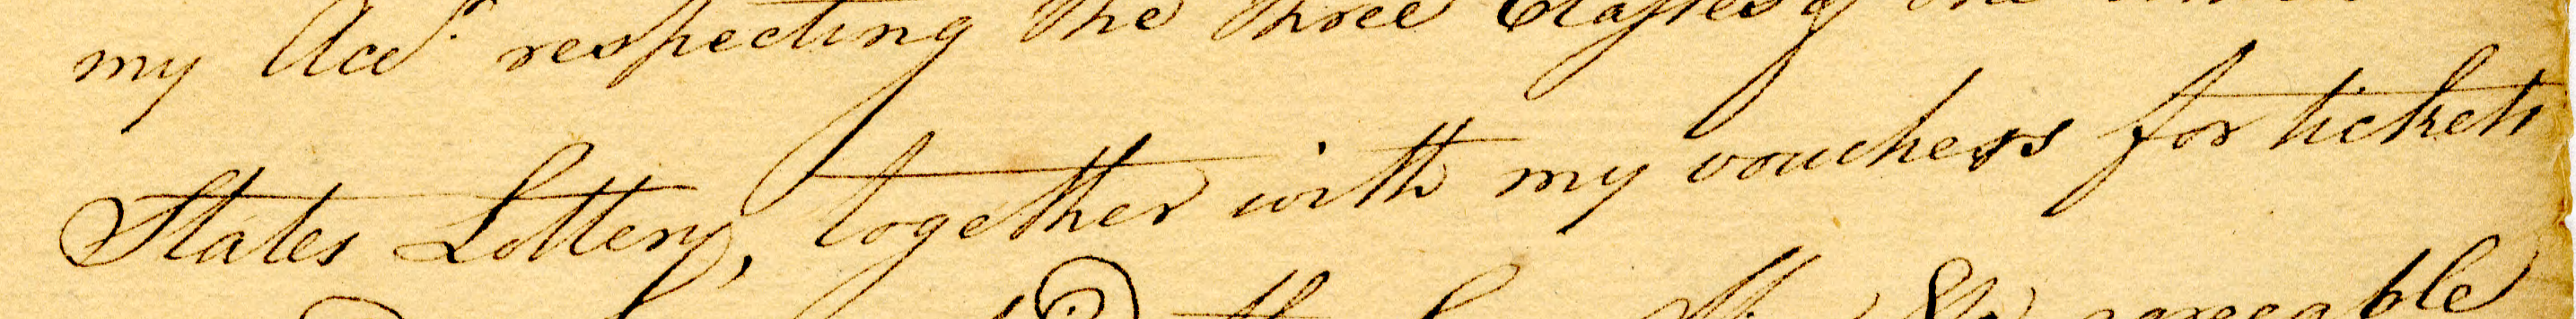States Lottery, together with my vouchers for tickets
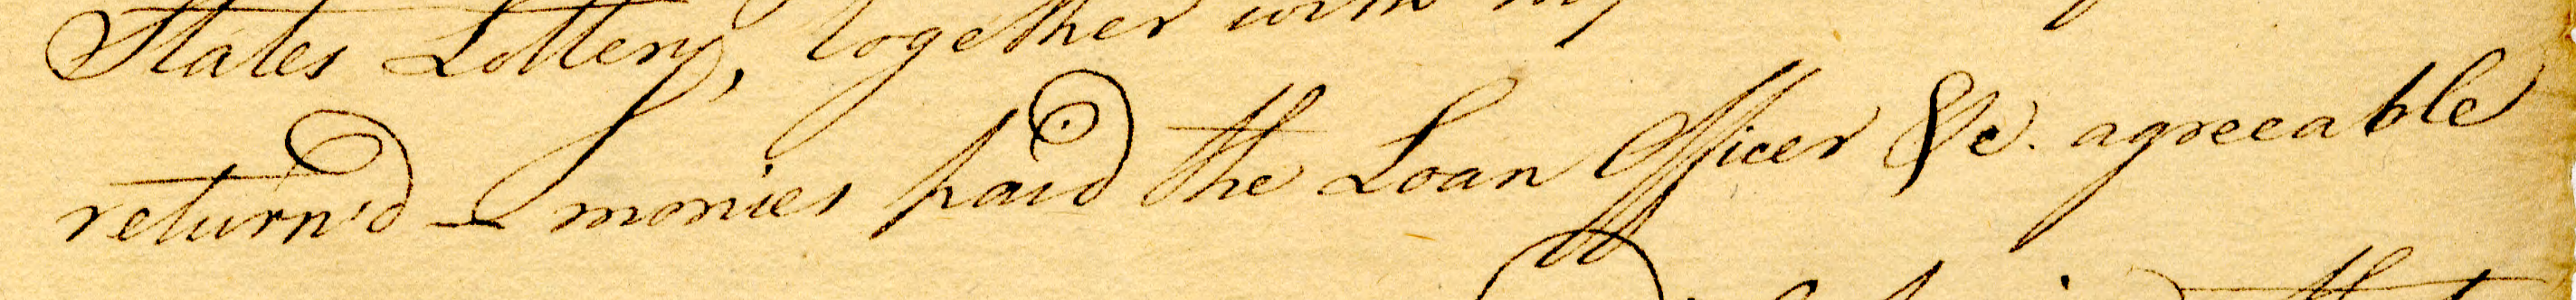return'd- monies paid the Loan Officer &c. agreeable
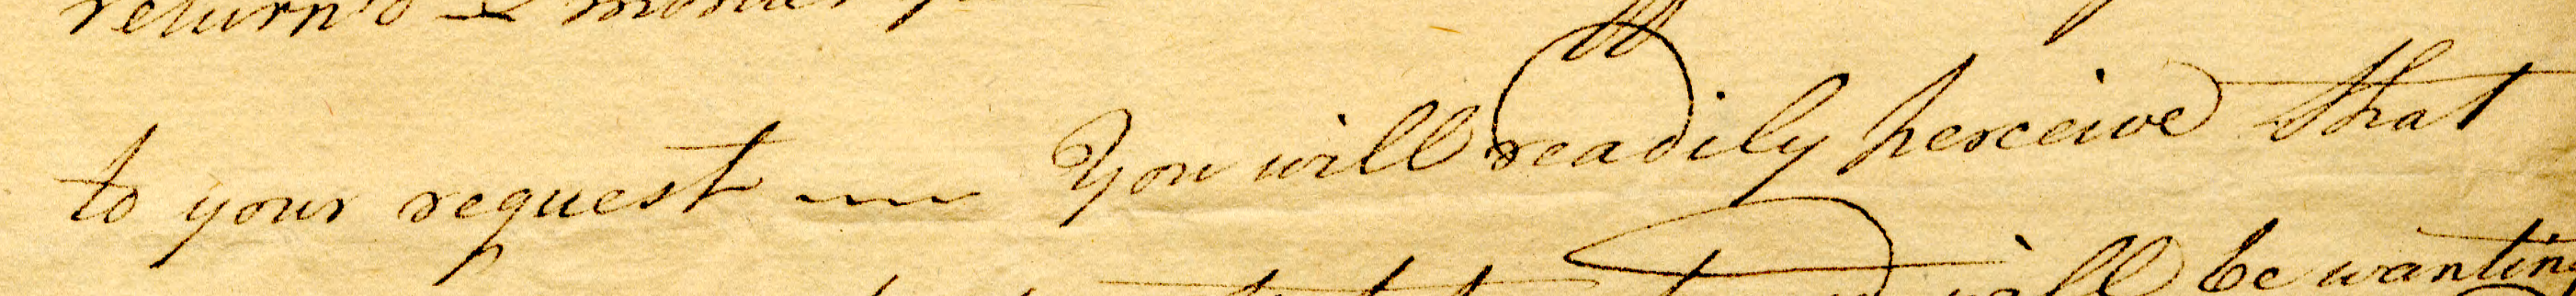to your request- You will be readily perceive that
